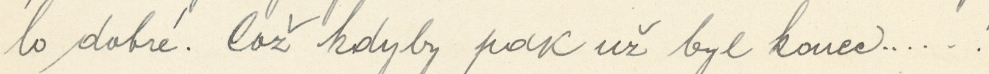lo dobré. Což kdyby pak už byl konec......!
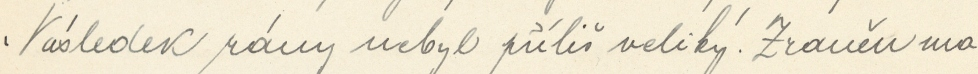Následek rány nebyl příliš veliký. Zraněn ma-
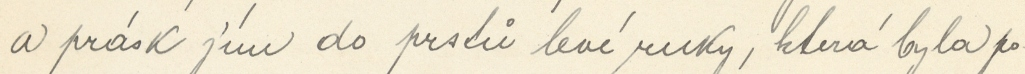a prásk jím do prstů levé ruky, která byla po-
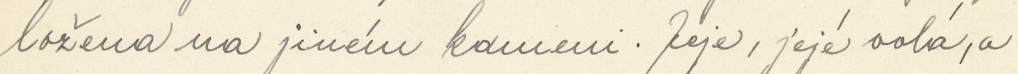ložena na jiném kameni. Jeje, jejé volá, a
